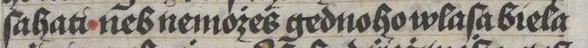ſahati.neb nemożeṡ gednoho wlaſa bíela
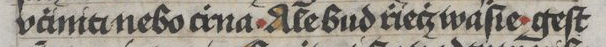vċiniti nebo ċrna.Ale bud ṙíecż waẛie.geſt
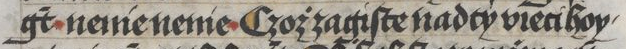ḡt.neníe neníe.Czoż zagiſte nadty vieci hoy¬
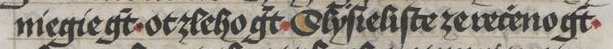níegíe ḡt.ot zleho ḡt.Slyſẛeli ſte ze reċeno ḡt.
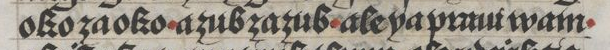oko za oko.zub za zub.ale ya praui wam.
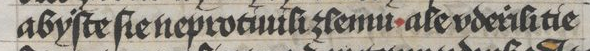abyẛte ſie neprotiuili zlemu.ale udeṙili tie
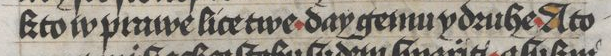kto w prawe líce twe.day gemu y druhe.A to¬
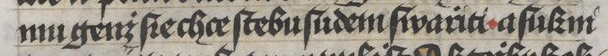mu genż ſie chce ſtebu ſudem ſwaṙiti.a ſukni
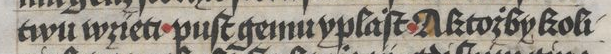twu wzieti.puſt gemu yplaẛt.A ktożby koli
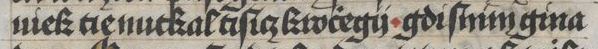uiek tie nutkal tiſicz kroċegij.gdi ſním gína
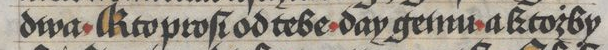dwa.Kto proſi od tebe.day gemu.a ktoż by
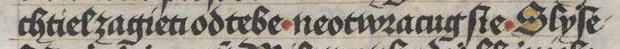chtiel zagíeti odtebe.neotwracug ſie.Slyẛe¬
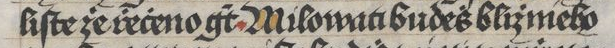li ſte że ṙeċerno ḡt.Milowati budeṡ bliżníeho
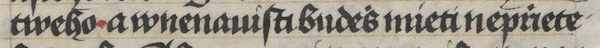tweho.a wnenauiſti budeṡ míeti nepṙiete¬
